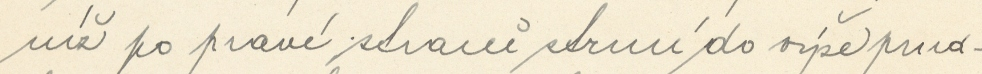níž po pravé straně strmí do výše prud-
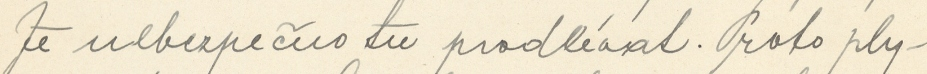Je nebezpečno tu prodlévat. Proto ply-
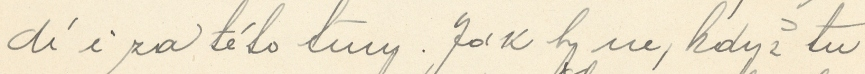dí i za této tmy. Jak by ne, když tu
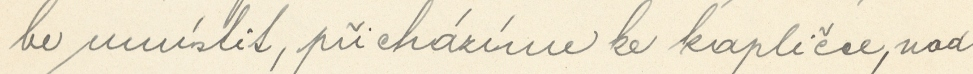be umístit, přicházíme ke kapličce, nad
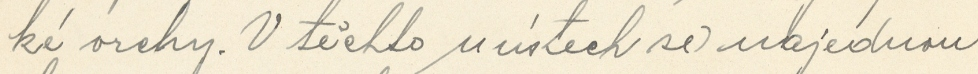ké vrchy. V těchto místech se najednou
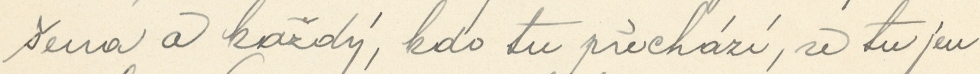šena a každý, kdo tu přechází, se tu jen
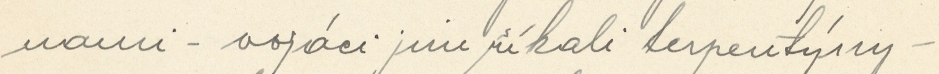nami - vojáci jim říkali terpentýny -
